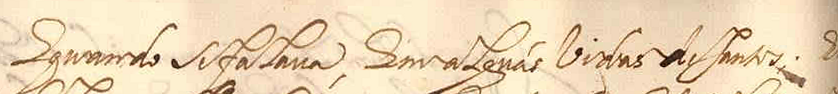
E quando se falaua, Em alguas̄ Vidas de Santos; E
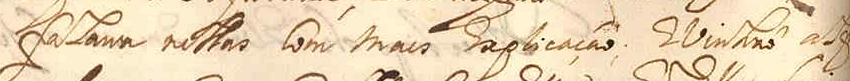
falaua nellas com mais Explicaçaõ, E vinhaõ alg
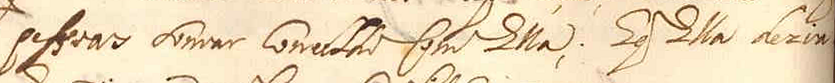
pessoas tomar Concelho Com Ella; E q̄ Ella dezia
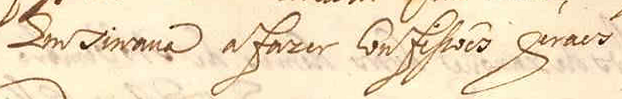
Emsinaua a fazer confissoẽs geraes
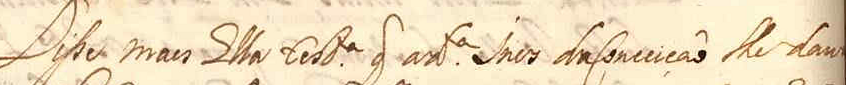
Disse mais Ella test.a q̄ a d.a Innes da Conceiçaõ lhe daua
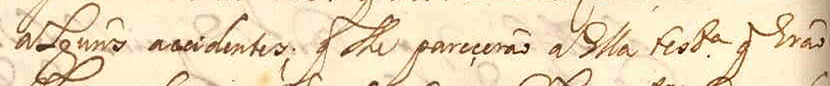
alguns acccidentes, q̄ lhe pareceraõ a Ella test.a q̄ Eraõ
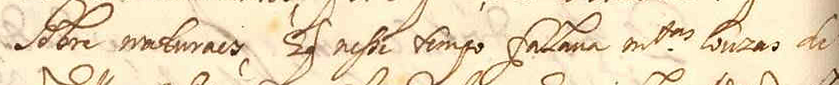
sobrenaturaes, E q̄ nesse tempo falaua m.tas couzas de
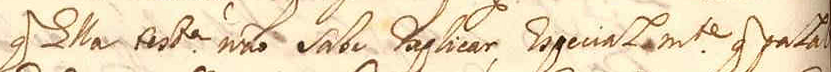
q̄ Ella test.a naõ sabe Explicar, Especialm.te q̄ pala
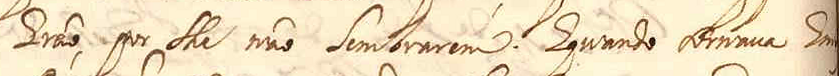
Eraõ, por lhe não lembrarem. E quando tornaua Em
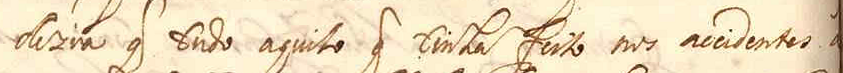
dezia q̄ tudo aquilo q̄ tinha feito nos accidentes
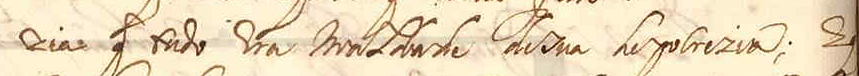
zia q̄ tudo Era maldade de sua hipocrezia; E
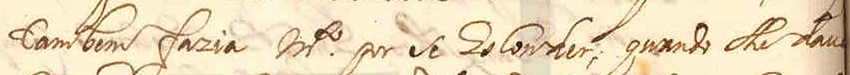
tambem fazia m.to por se EsConder, quando lhe daua
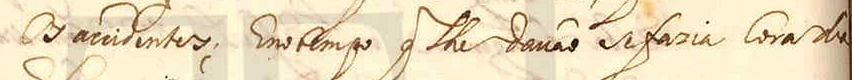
Os accidentes, E no tempo q̄ lhe dauaõ se fazia Corada
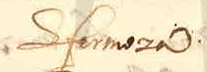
E fermoza.
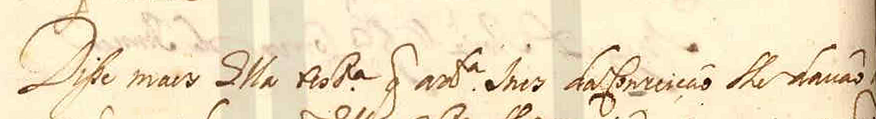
Disse mais Ella test.a q̄ a d.a Ines da Conceiçaõ lhe dauaõ
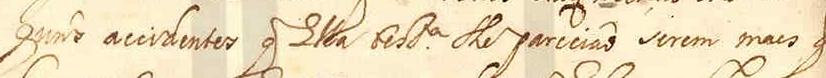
guns accidentes q̄ Ella test.a lhe pareciaõ serem mais q̄
